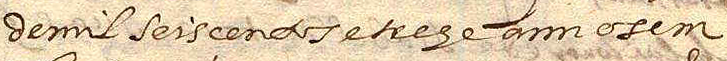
de mil seiscentos e treze annos em
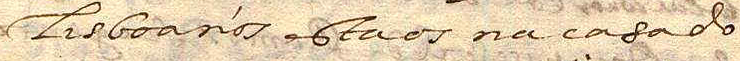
Lisboa nos estaos na casa do
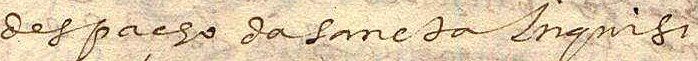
despacho da sancta Inquisi
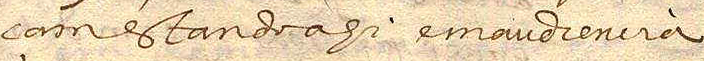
çam estando hi em audiencia
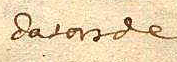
da tarde
